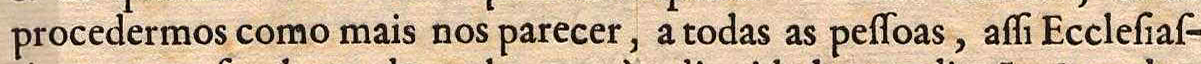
procedermos como mais nos parecer, a todas as pessoas, assi Ecclesias
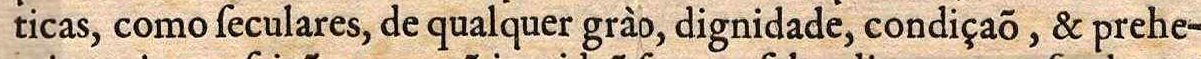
ticas, como seculares, de qualquer grào, dignidade, condiçaõ, & prehe
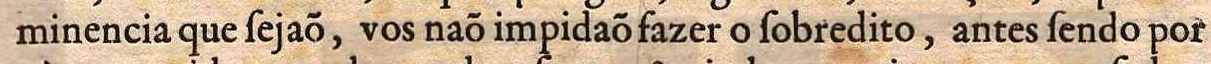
minencia que sejaõ, vos naõ impidaõ fazer o sobredito, antes sendo por
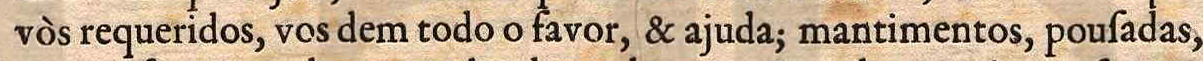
vòs requeridos, vos dem todo o favor, & ajuda; mantimentos, pousadas,
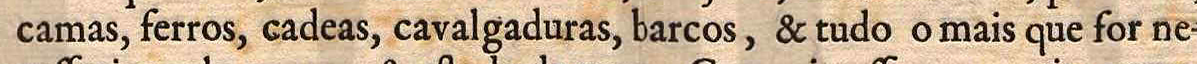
camas, ferros, cadeas, cavalgaduras, barcos, & tudo o mais que for ne
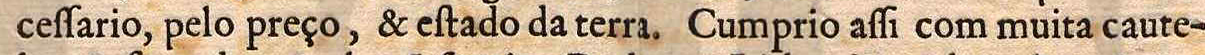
cessario, pelo preço, & estado da terra. Cumprio assi com muita caute
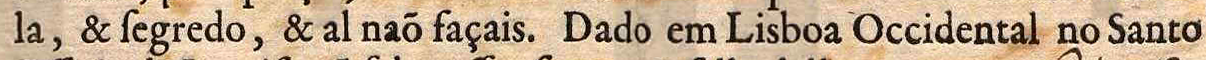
la, & segredo, & al naõ façais. Dado em Lisboa Occidental no Santo
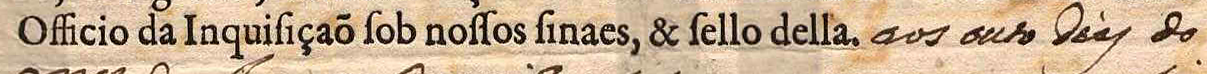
Officio da Inquisiçaõ sob nossos sinaes, & sello della. aos outo dias do
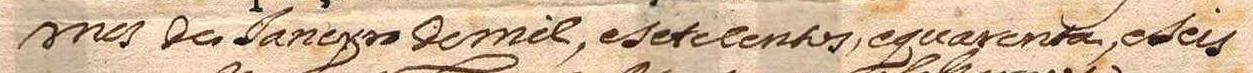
mes de Ianeyro de mil, e setecentos, e quarenta, e seis
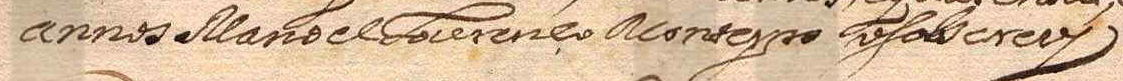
annos Manoel Lourenço Monteyro o sobscrevj
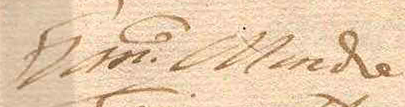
Fra.co Mando
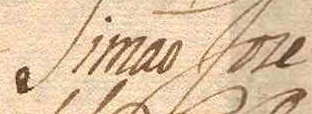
Simaõ Joze
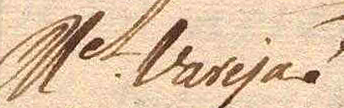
Mel Varejaõ
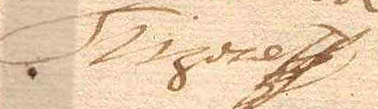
Trigozo
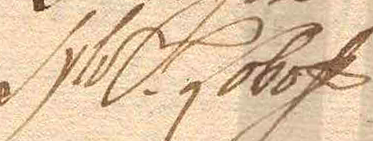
Sylv.ro Lobo
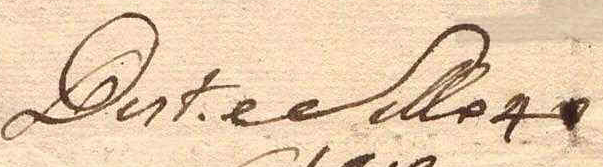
Dest.e Sello 40
